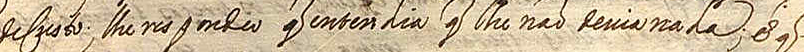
de Custo; lhe respondeo q̄ entendia q̄ lhe não deuia nada; e q̄.
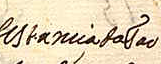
Estançia da Tar
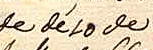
de de 10 de
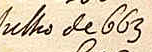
Iulho de 663
